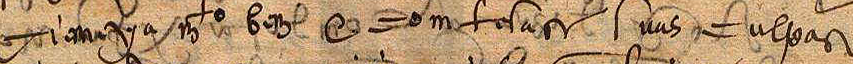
çiemcya mto bem e comfesase suas culpas
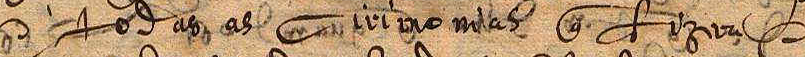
e todas as Cirimonias q̄ fizera e
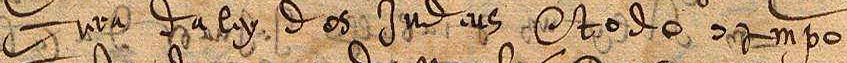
crera da ley dos Judeus e todo o tempo
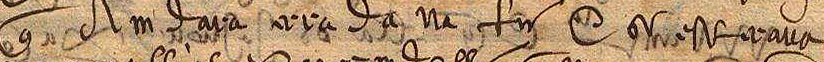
q̄ Amdaua errada na fee E se esperaua
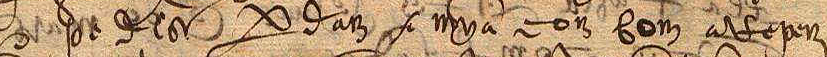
e pedise ꝑdam e mȳa com bom aRepem
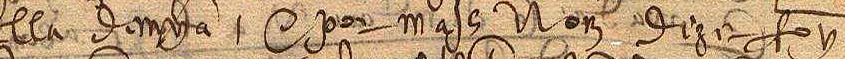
ella de mȳa / e por maJs Nom dizer foy
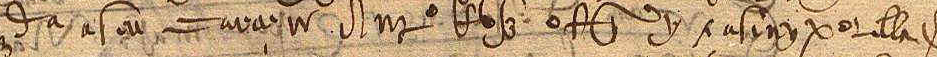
mda a seu carçere Anto RōJz o stp̄vy e asiney por ella
